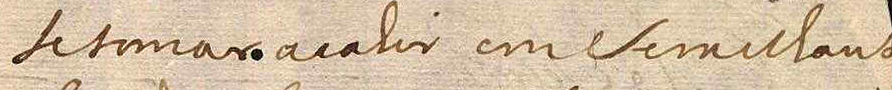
se tornar a cahir em Semelhant
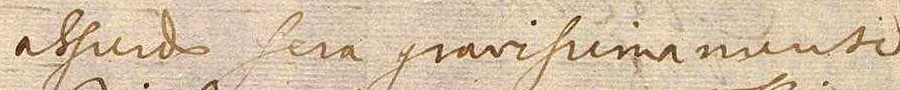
absurdo sera gravissimamente
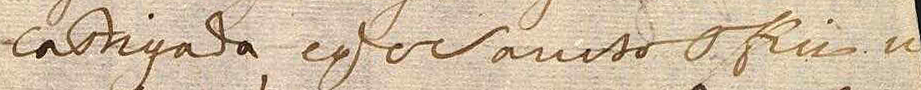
castigada e q̄ o sancto officio u
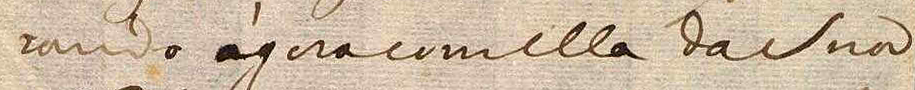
zando agora com ella da Sua
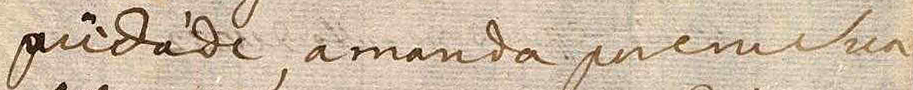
peidade a manda por em Sua
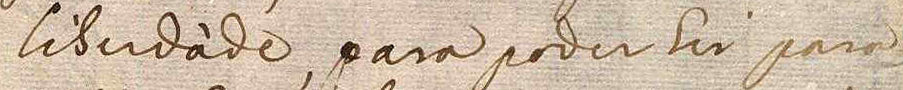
liberdàde para poder hir para
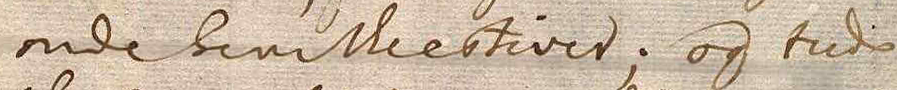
onde bem lhe estiver; o q̄ tudo
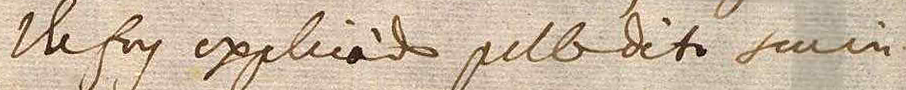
lhe foy explicado pello dito seu in
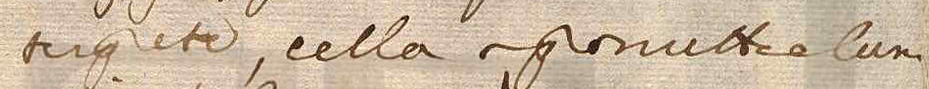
terprete, e ella o prometteo Cum
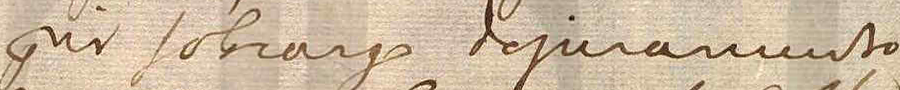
prir sobcargo do juramento
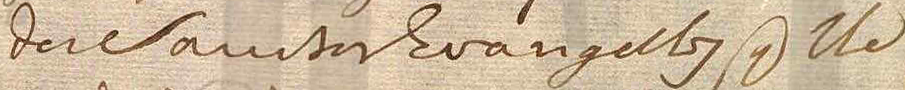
dos Samtos Evangelhos, q̄ lhe
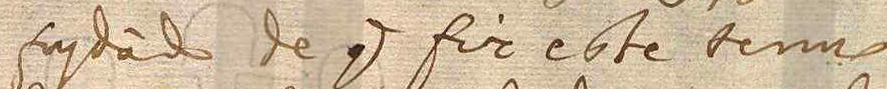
foy dàdo de q̄ fiz este termo
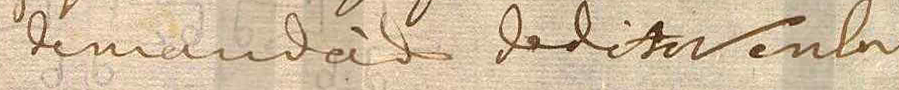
de mandado do dito Senhor
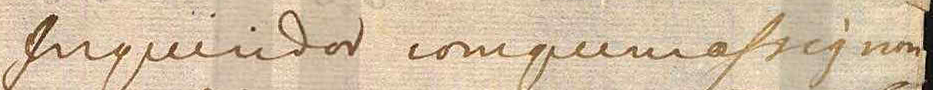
Jnquizidor com quem assignou
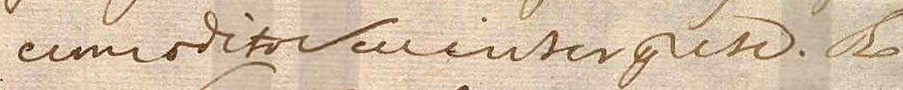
e com o dito seu enterprete. Tho
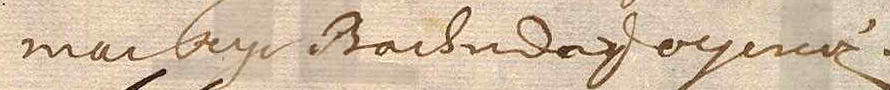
mas Feyo Barbuda q̄ o escrevi
